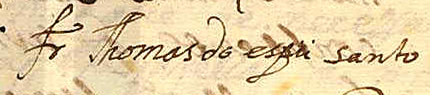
Fr thomas do espu santo
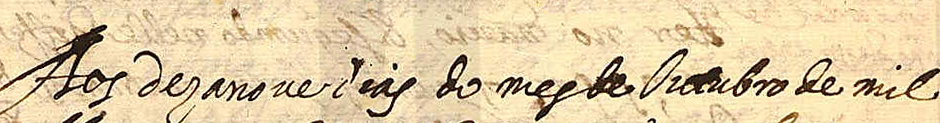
Aos dezanoue dias do mes de Outubro de mil
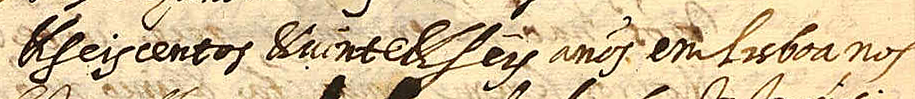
& seiscentos & uinte & seis anōs em Lisboa nos
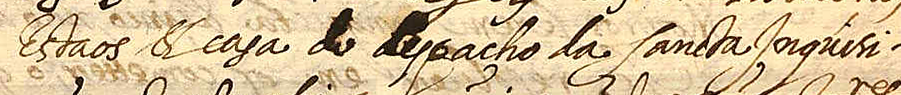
Estaos & casa do despacho da Sancta Jnquisi
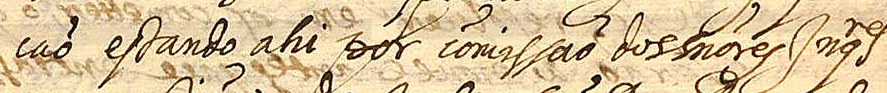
çaõ estando ahi por cōmissaõ dos snor̄es Jnqres
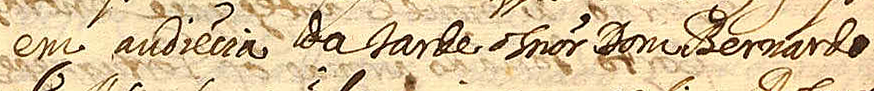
em audiēcia da tarde o snor̄ Dom Bernardo
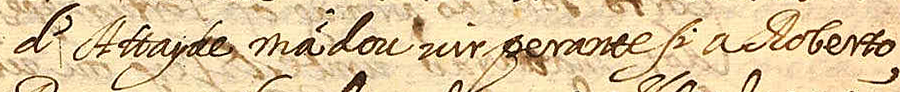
d'Attayde mādou uir perante si a Roberto
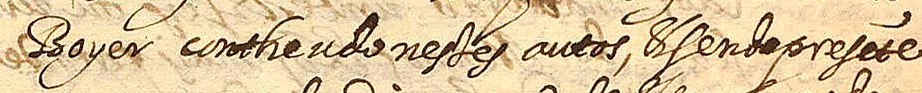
Boyer contheudo nestes autos, & sendo presēte
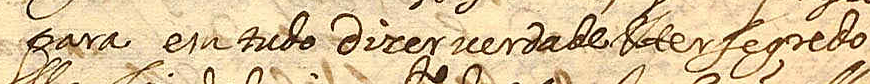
para em tudo dizer uerdade & ter segredo
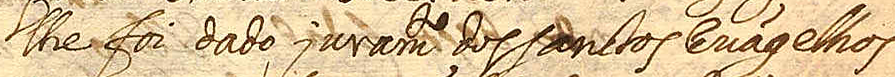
lhe foi dado juramto dos sanctos Euāgelhos
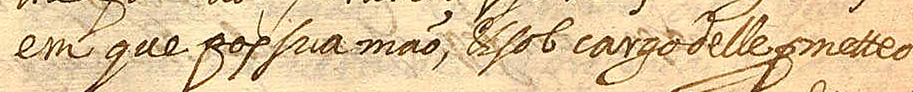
em que pos sua maõ, & sob cargo delle ꝓmetteo
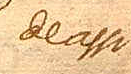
de assi
